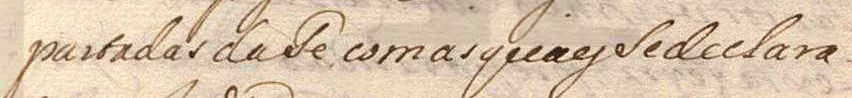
partadas da Fe com as quaes se declara
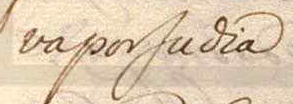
va por Judia
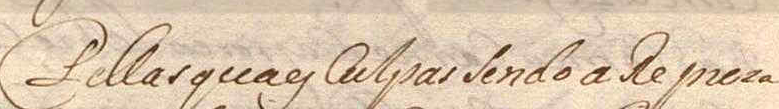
Pellas quaes Culpas sendo a Re preza
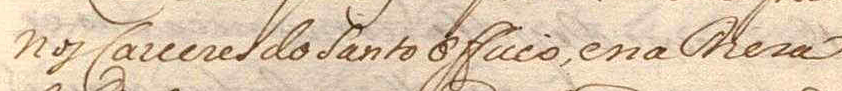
nos Carceres do Santo officio, e na Meza
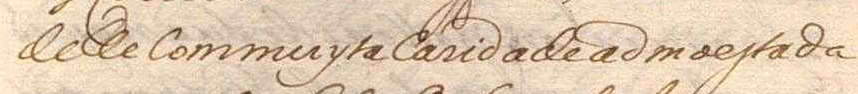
delle Com muyta caridade admoestada
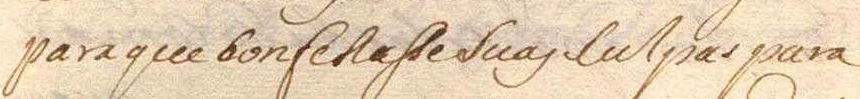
para que confessasse suas culpas para
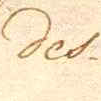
des
